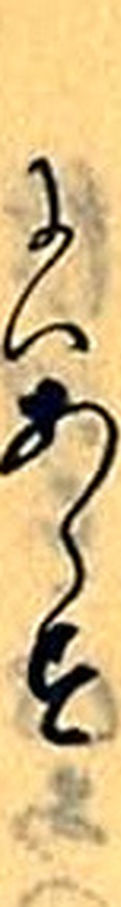にはあらす
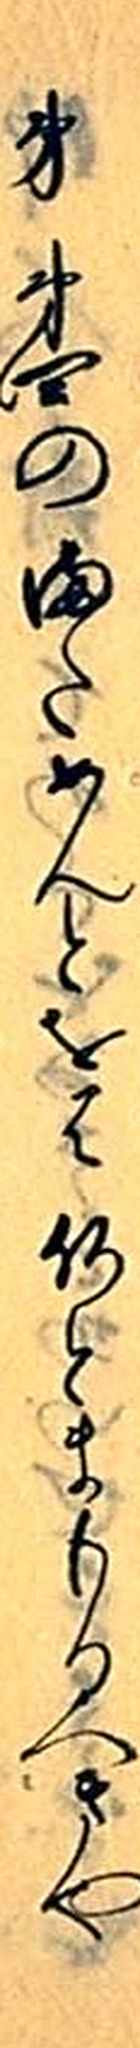弟第四のまためんとをは何とまもるへきや
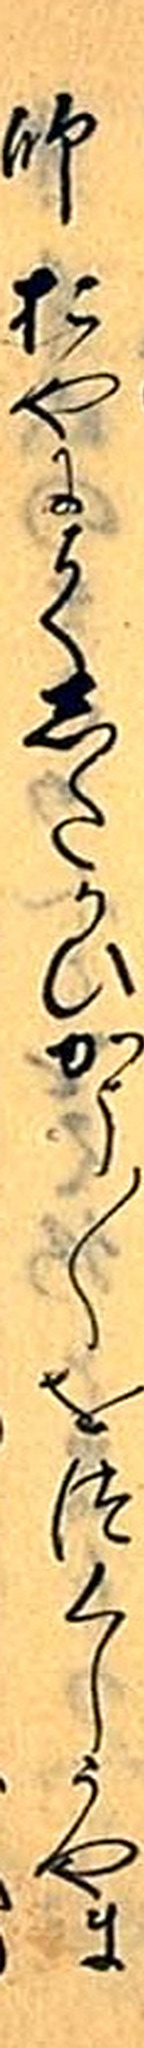師おやによくしたかひかう〳〵をつくしうやま
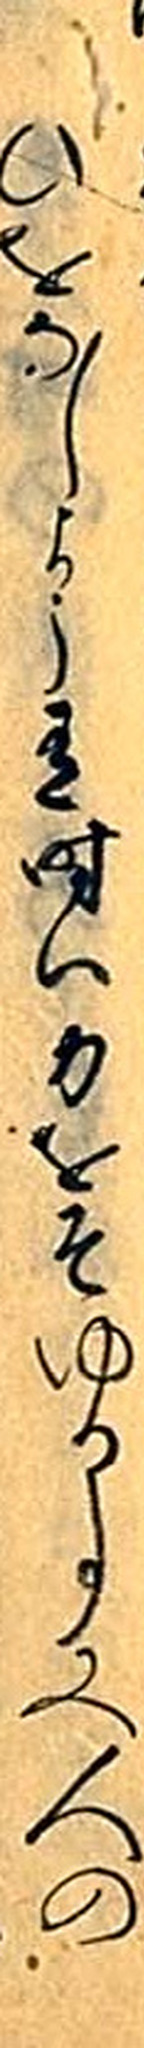ひをなしよう有時は力をそゆる事又人の
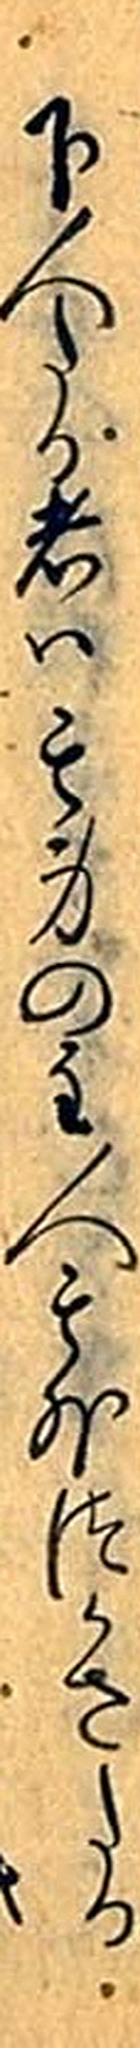下人たる者は其身の主人其外つかさたる
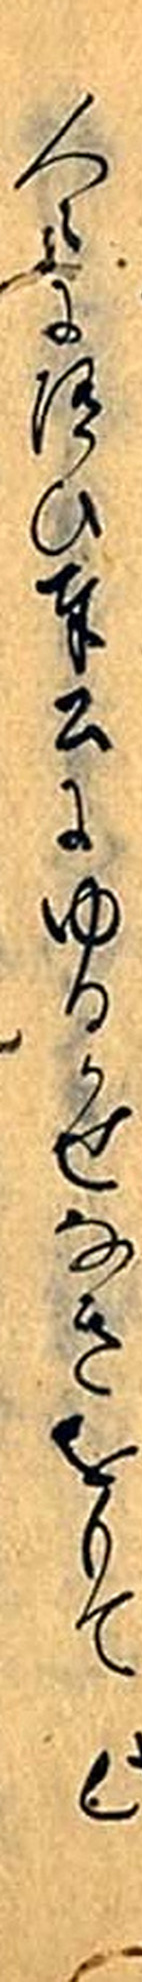人々に随ひ奉公にゆるかせなきをもて此
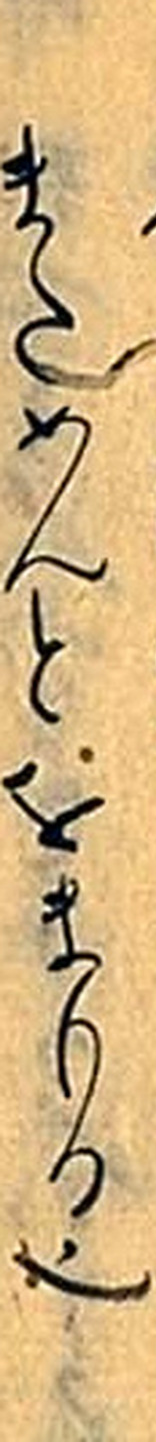まためんとをまもる也
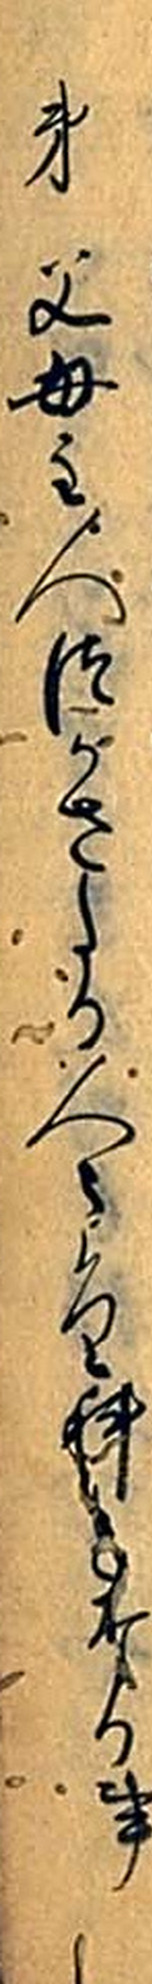弟父母主人つかさたる人々より科なる事

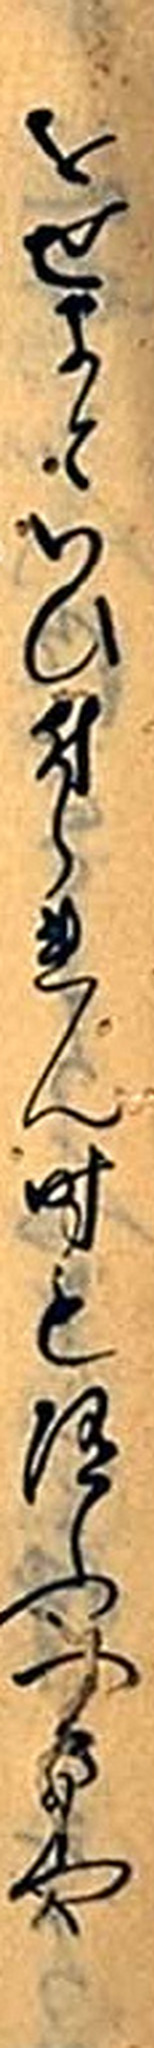をせよといひ付られん時も随ふへきや
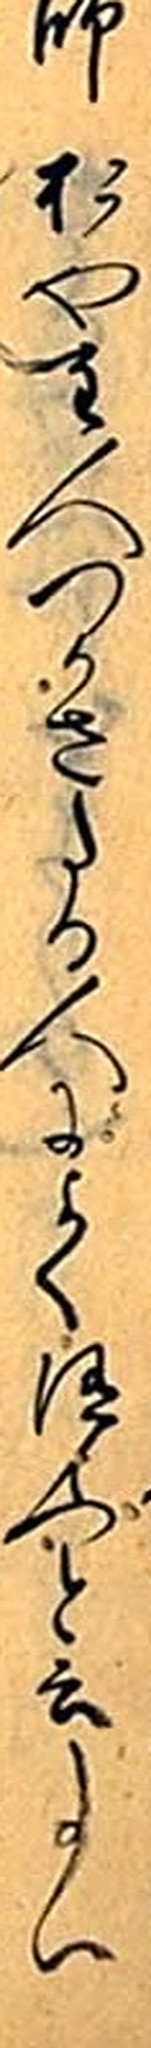師おや主人つかさたる人によく随ふと云事は
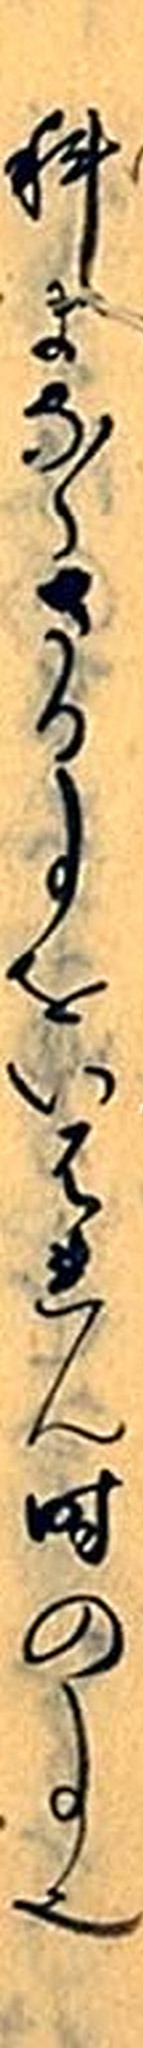科にならさる事をいはれん時の事也
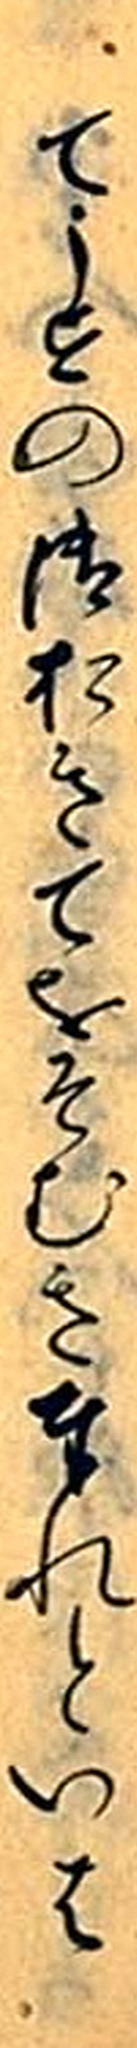てうすの御おきてをそむき奉れといは
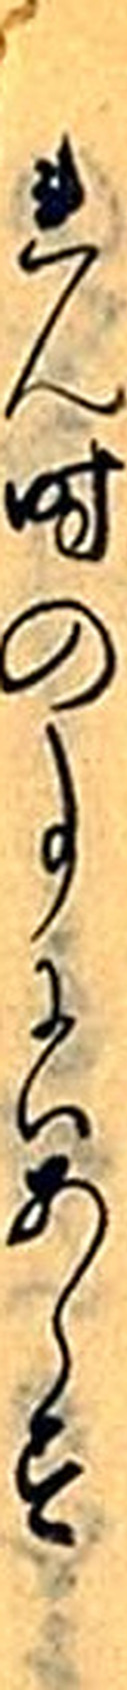れん時の事にはあらす
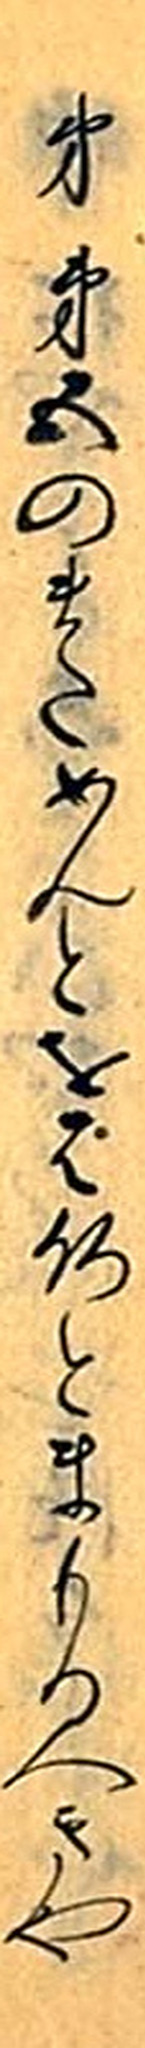弟第五のまためんとをは何とまもるへきや
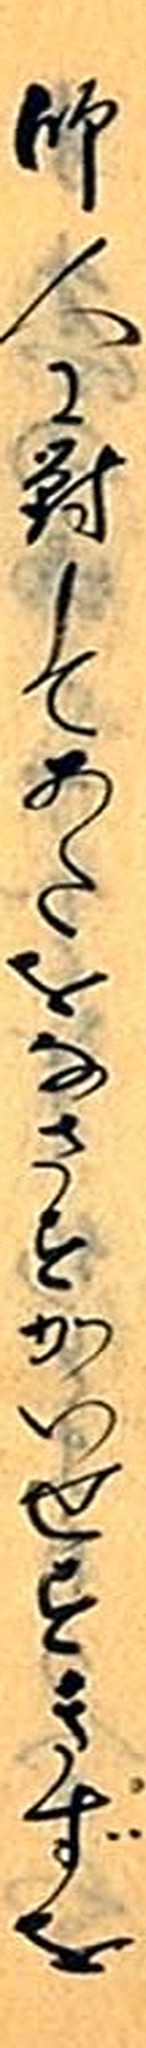師人に対してあたをなさすかいせすきずを
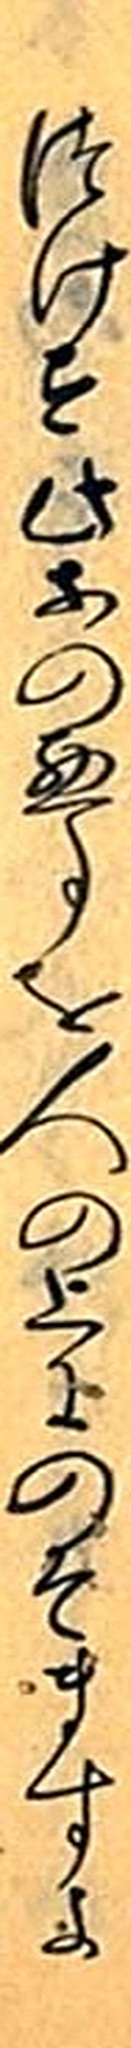つけす此等の悪事を人の上にのそますよ
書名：ドチリナ・キリシタン
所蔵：東京大学総合図書館 / General Library in the University of Tokyo
